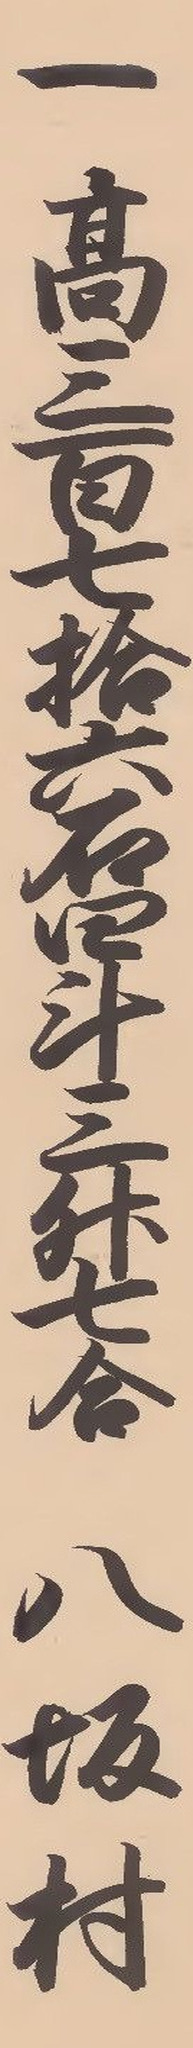一高三百七拾六石四斗三升七合八坂村
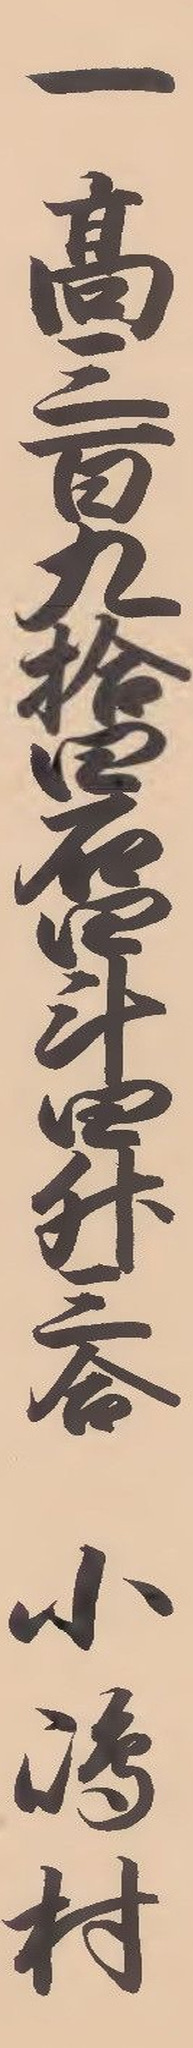一高三百九拾四石四斗四升三合小島村
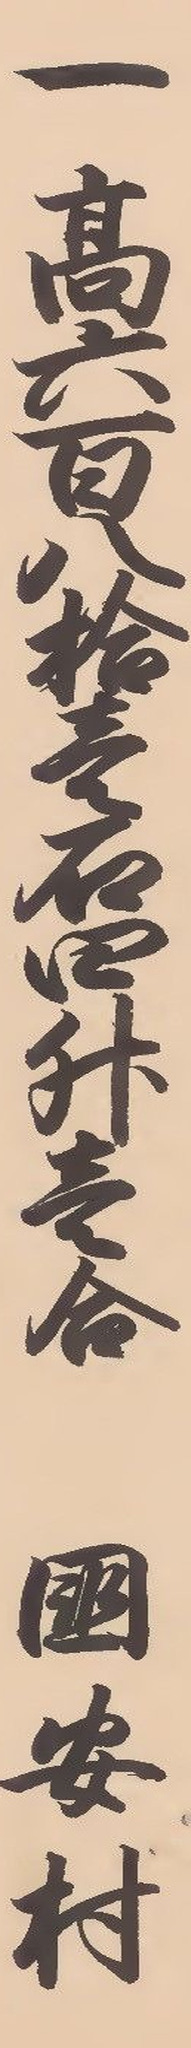一高六百八拾壱石四升壱合国安村
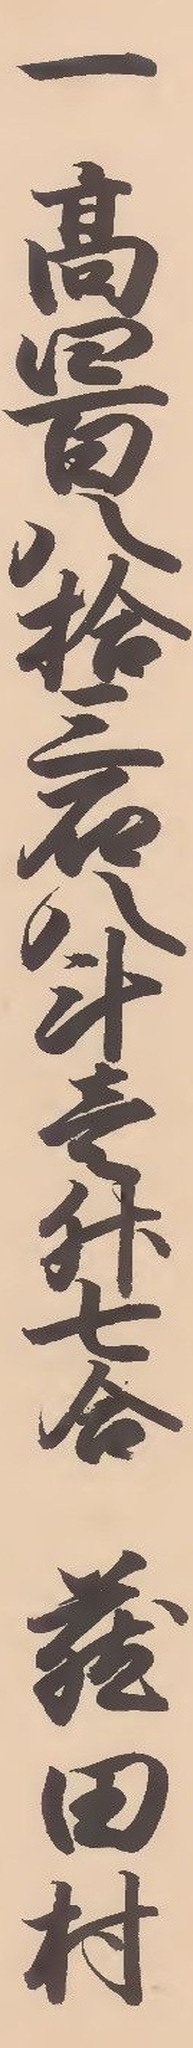一高四百八拾三石八斗壱升七合蔵田村
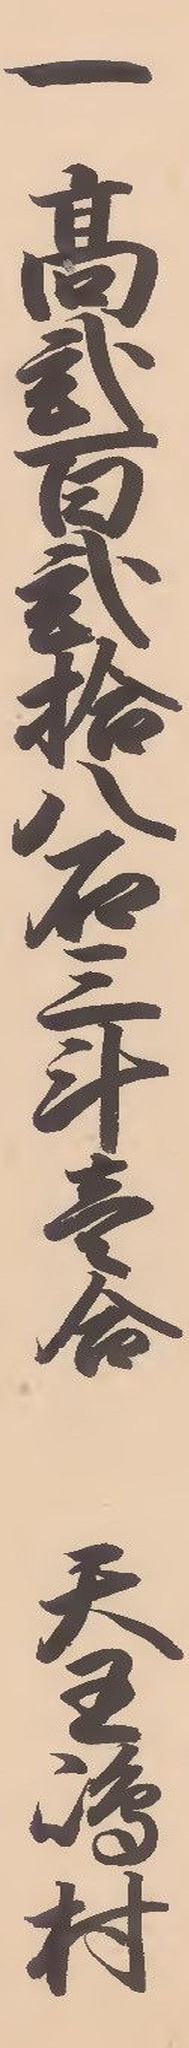一高弐百弐拾八石三斗壱合天王島村

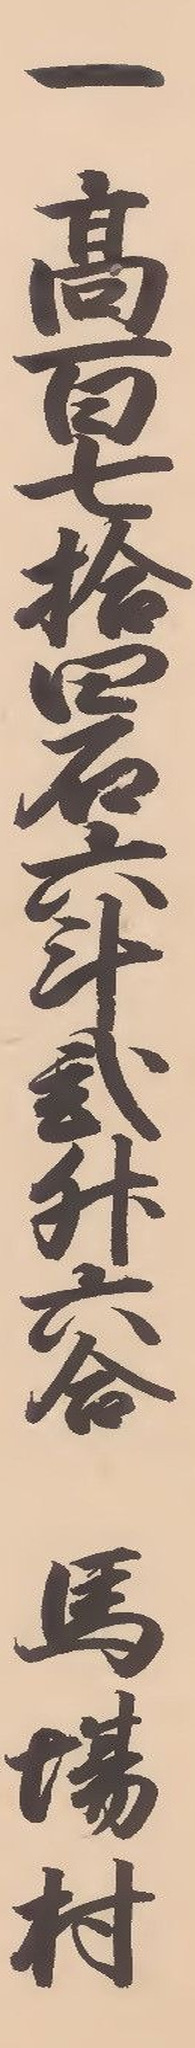一高百七拾四石六斗弐升六合馬場村
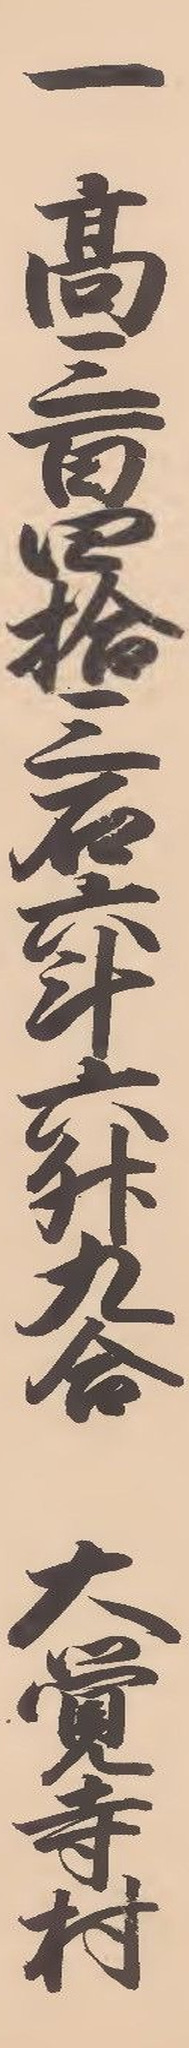一高三百四拾三石六斗六升九合大覚寺村
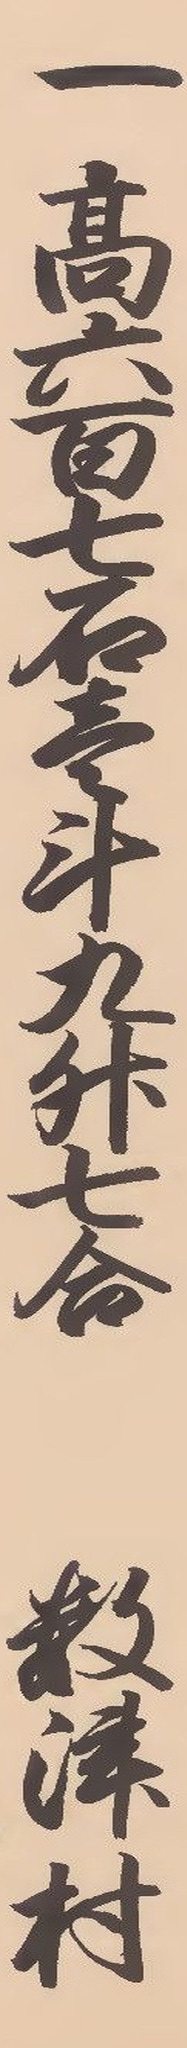一高六百七石壱斗九升七合数津村
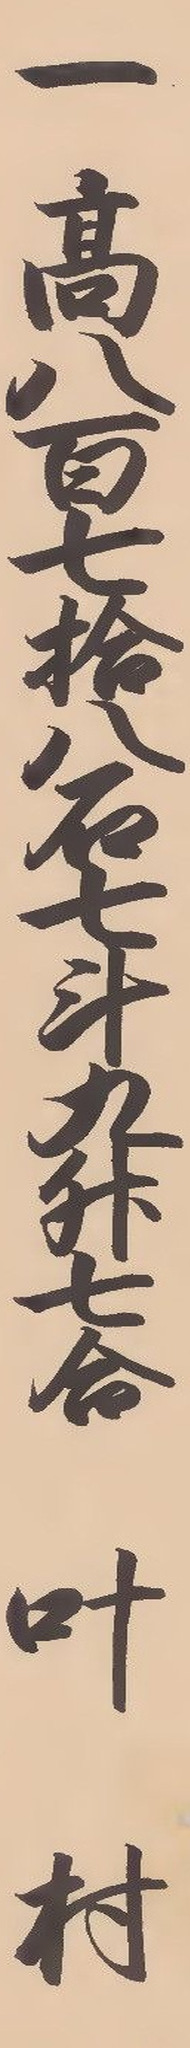一高八百七拾八石七斗九升七合叶村
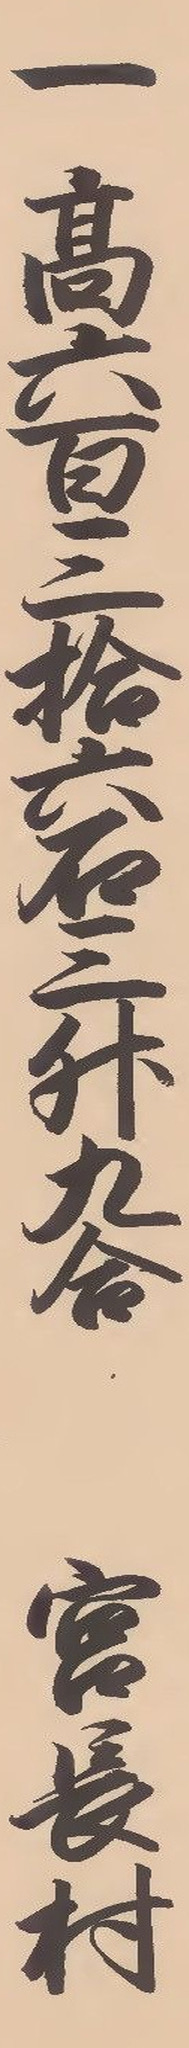一高六百三拾六石三升九合宮長村

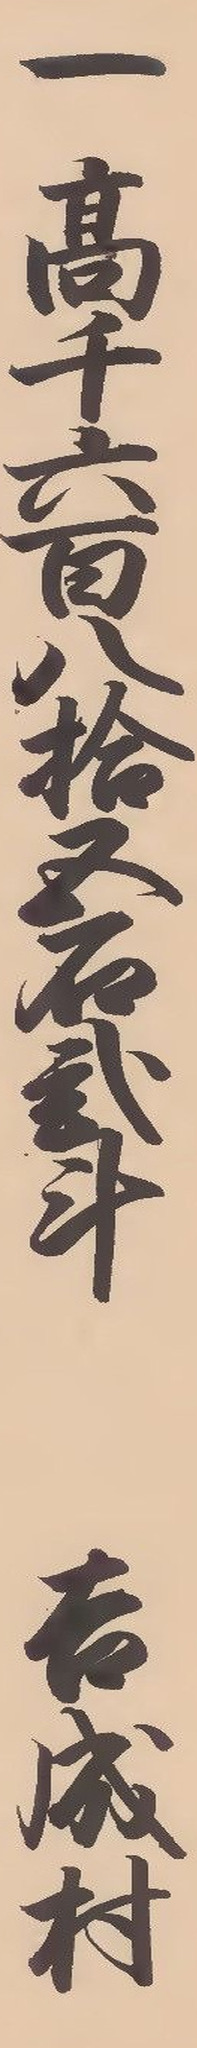一高千六百八拾五石弐斗吉成村
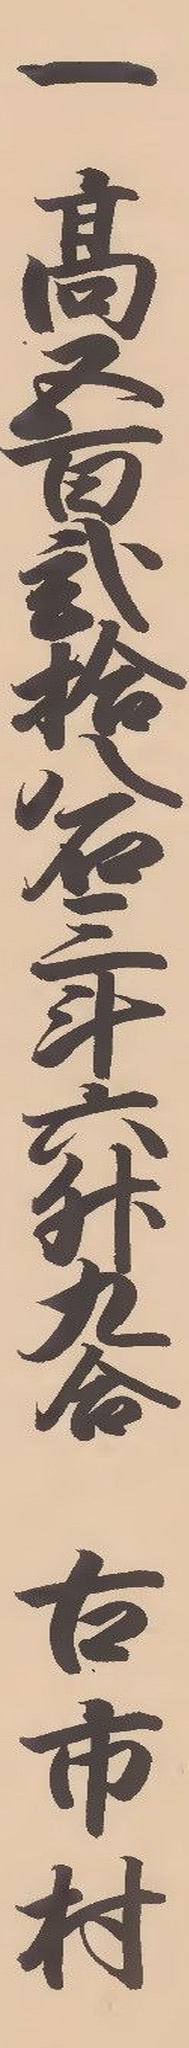一高五百弐拾八石三斗六升九合古市村
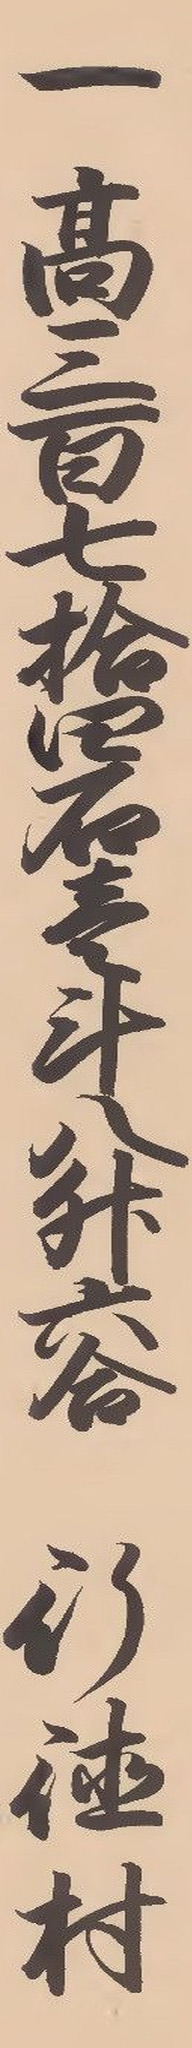一高三百七拾四石壱斗八升六合行徳村
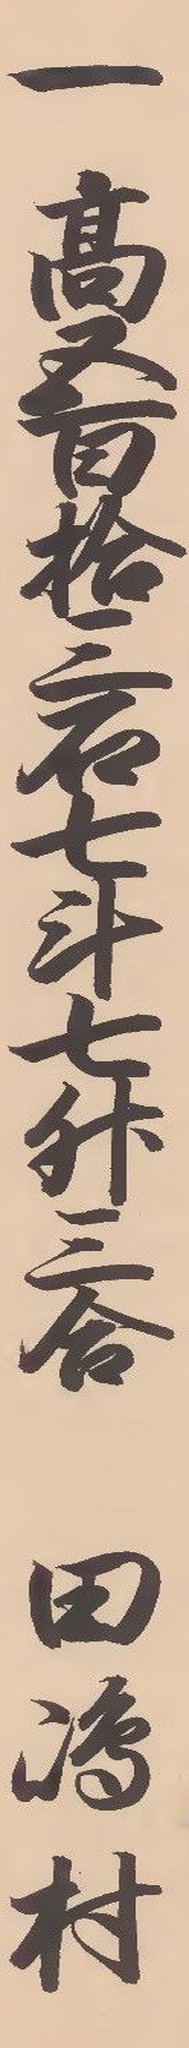一高五百拾三石七斗七升三合田島村
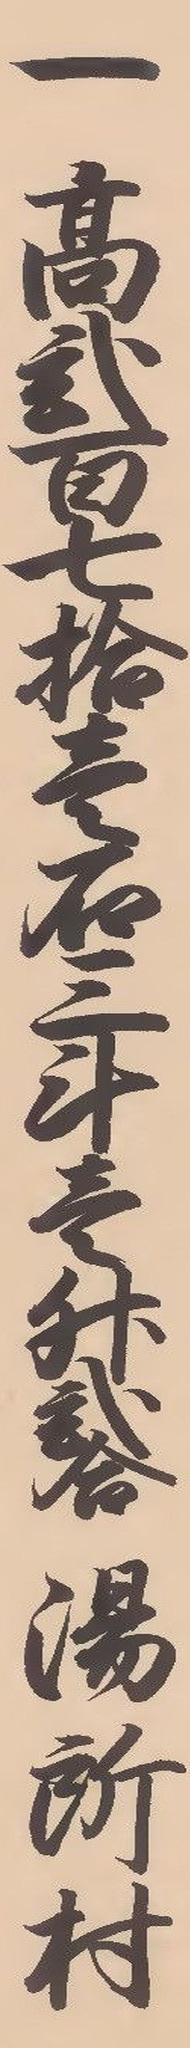一高弐百七拾壱石三斗壱升弐合湯所村
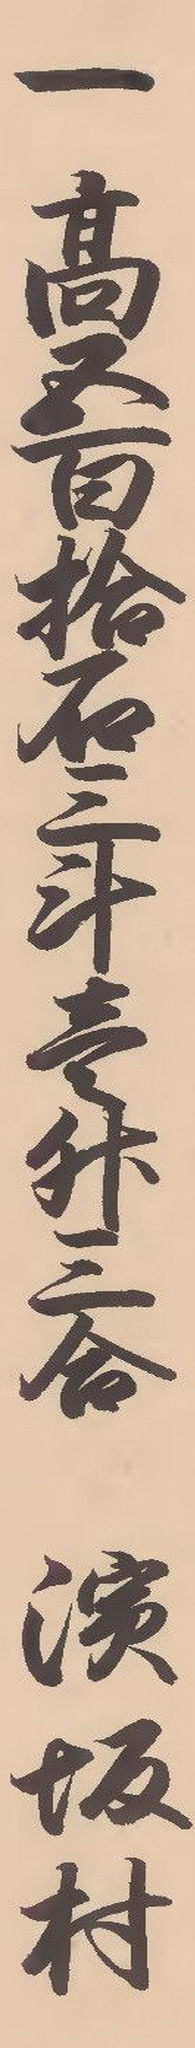一高五百拾石三斗壱升三合浜坂村
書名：因幡国郷帳
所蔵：国立公文書館 National Archives of Japan
